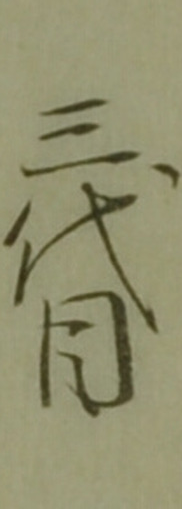三代目
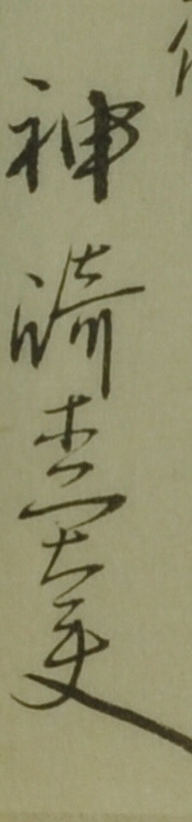神崎杢太夫
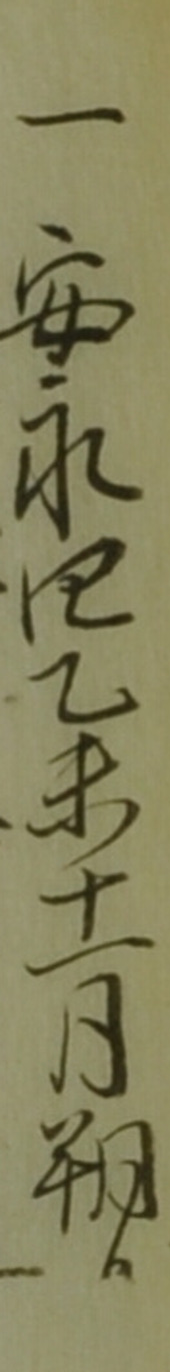一安永四乙未十一月朔日
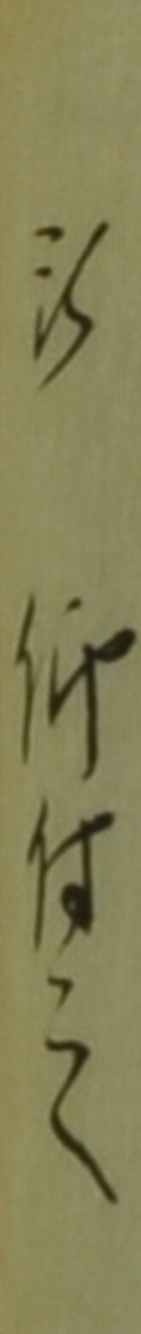被仰付之
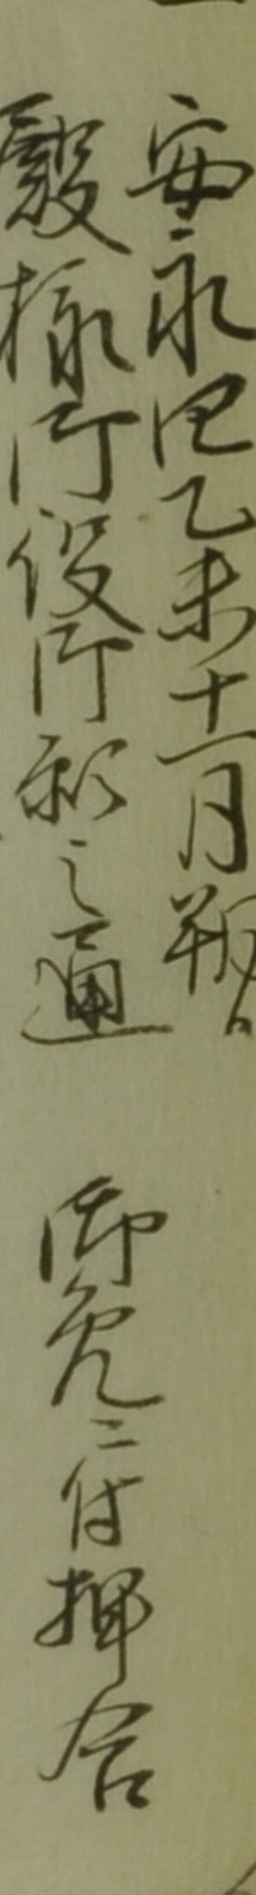殿様御役御願之通御免ニ付押合
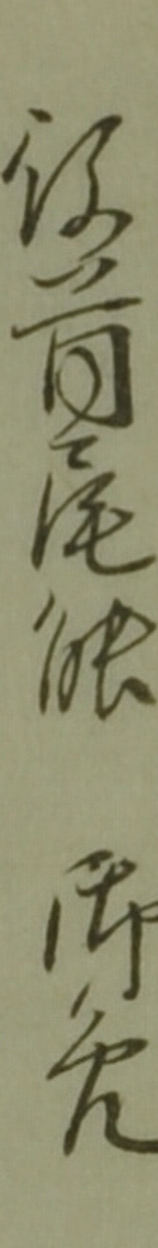役首尾能御免
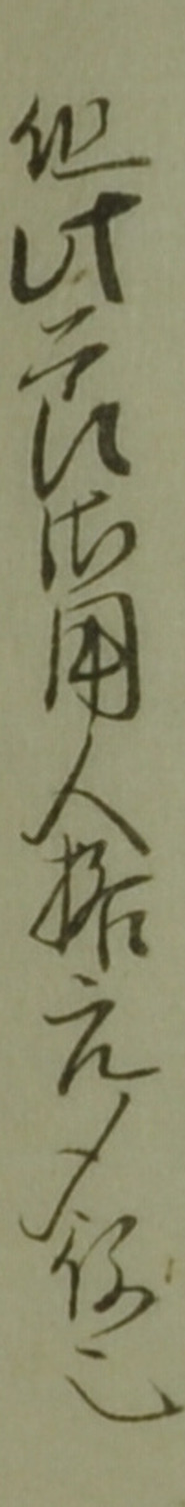但此節御用人格元〆役也
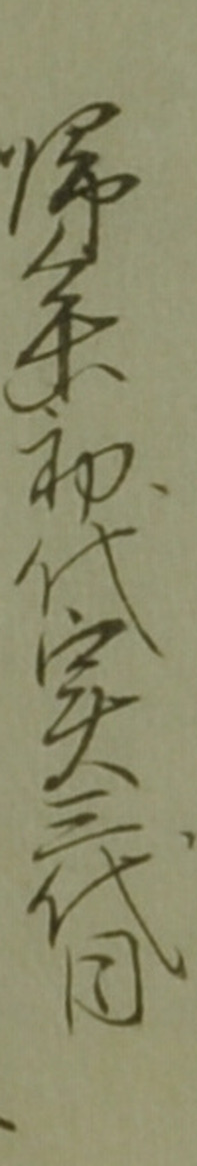帰参初代実三代目
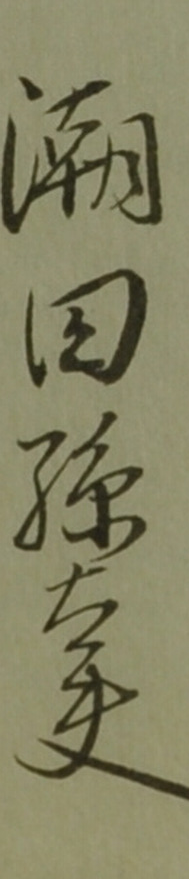潮田孫太夫
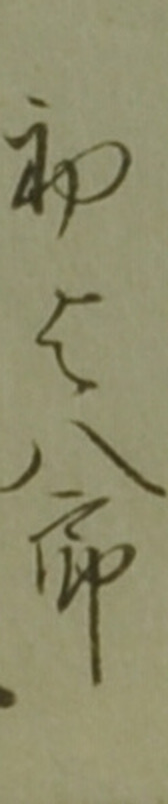初与八郎
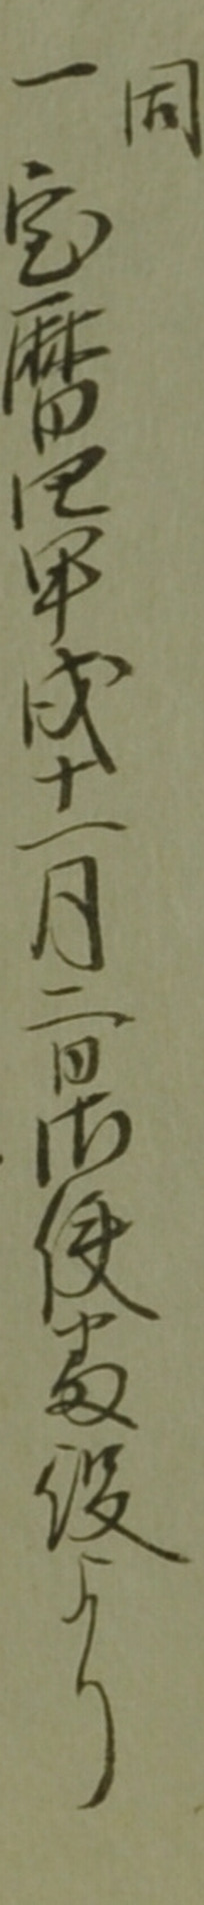一宝暦四甲戌十一月二日御使番役より
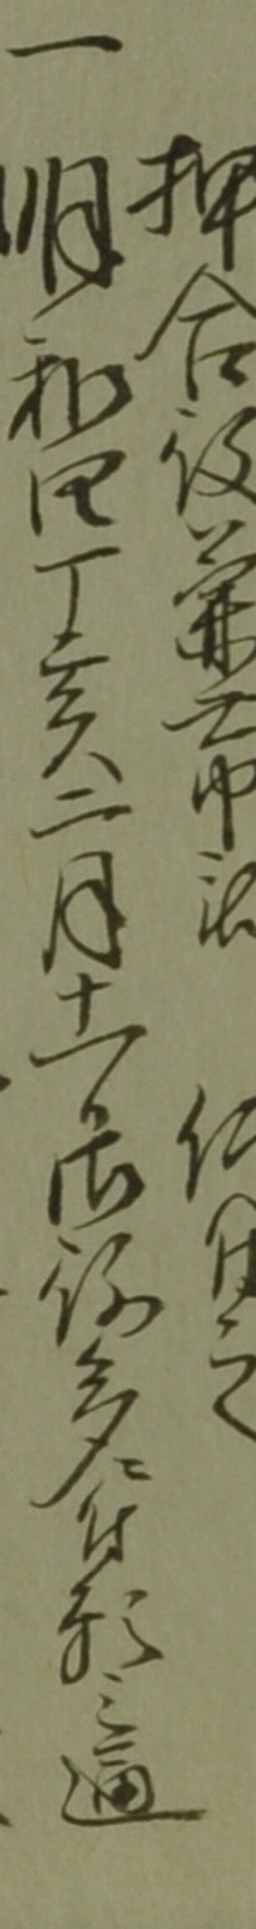一明和四丁亥二月十一日御役多ニ付願之通
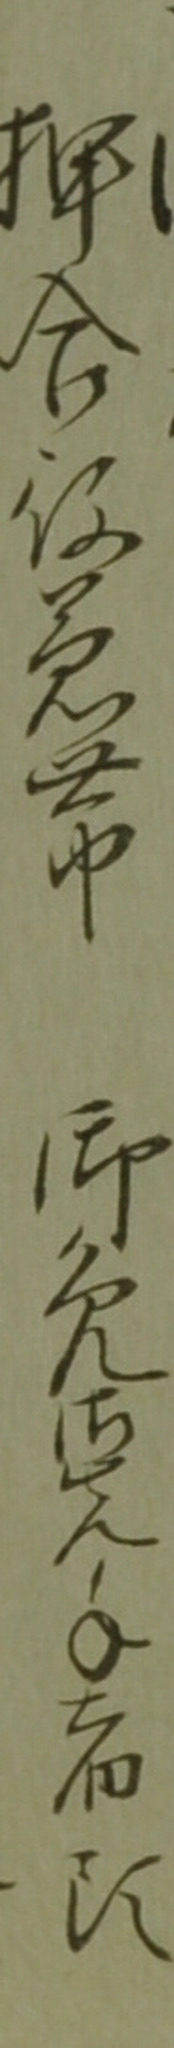押合役兼帯御免御先年者頭
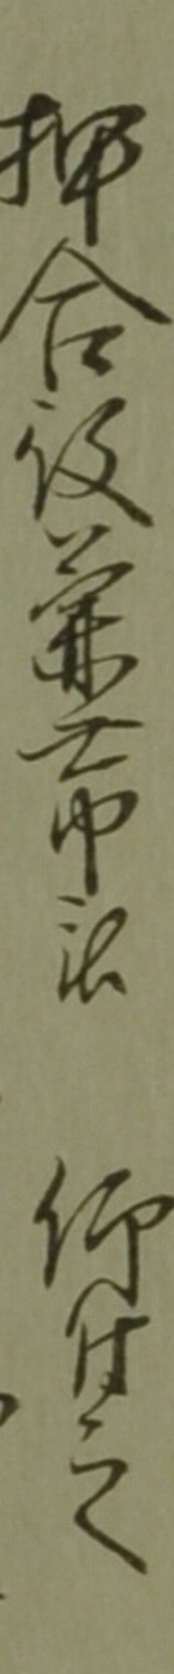押合役兼帯被仰付之
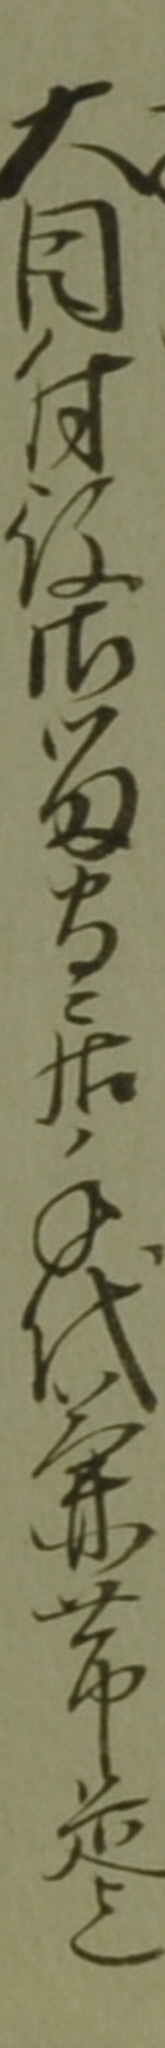大目付役御留守居手代兼帯是迄
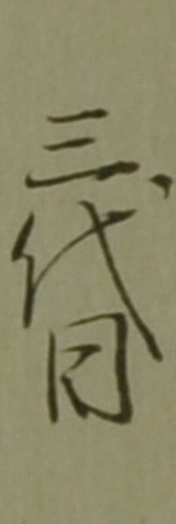三代目
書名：諸御役代々録（七）
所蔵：伊那市立高遠町図書館・合同会社AMANE
